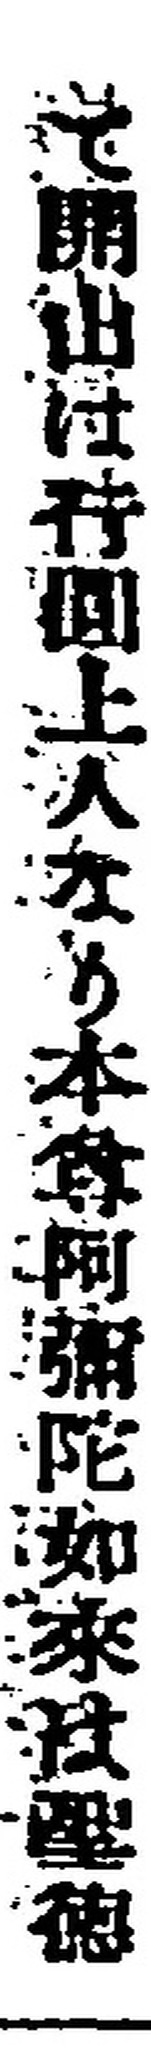て開山は行円上人なり本尊阿弥陀如来は聖徳
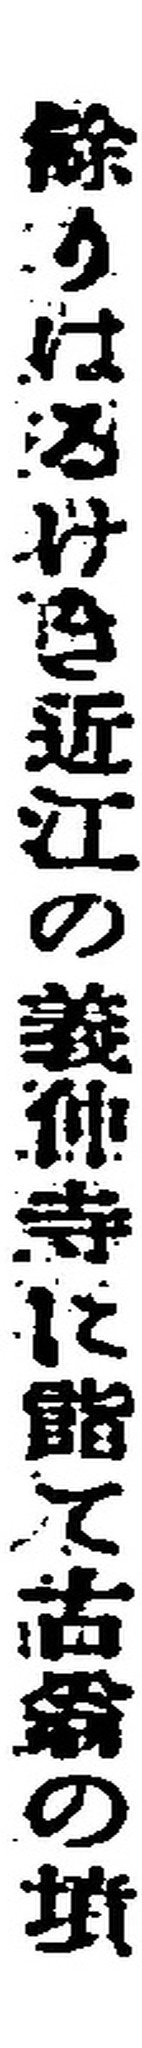余りはるけき近江の義仲寺に詣て古翁の墳
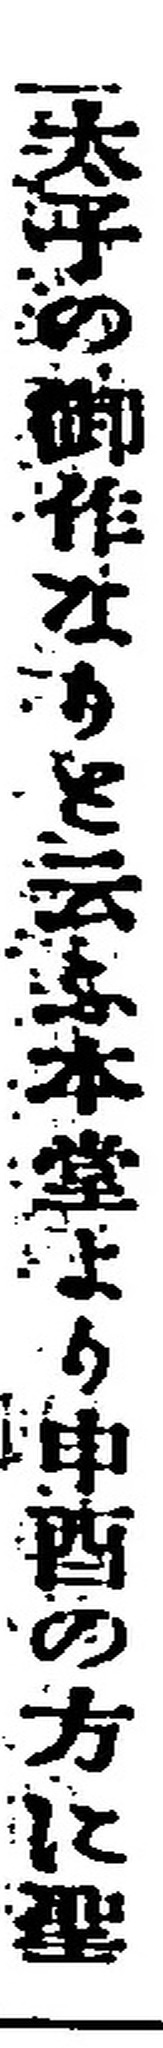太子の御作なりと云ふ本堂より申酉の方に聖
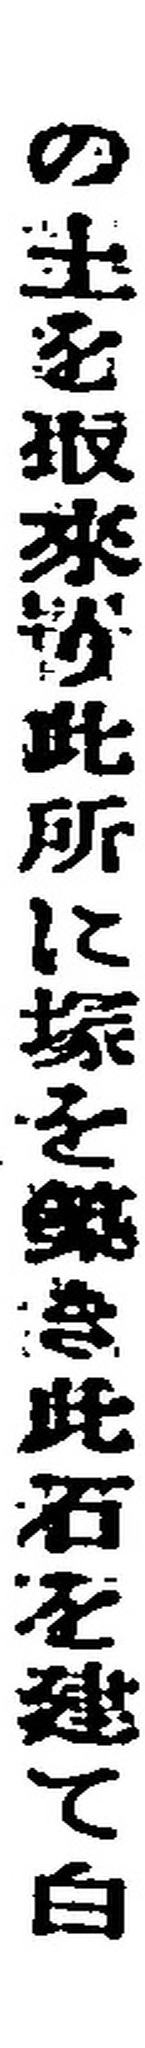の土を取来り此所に塚を築き此石を建て白
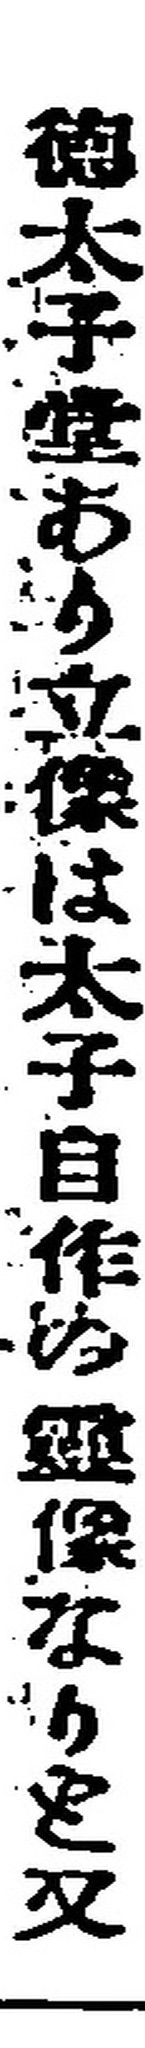徳太子堂あり立像は太子自作の霊像なりと又
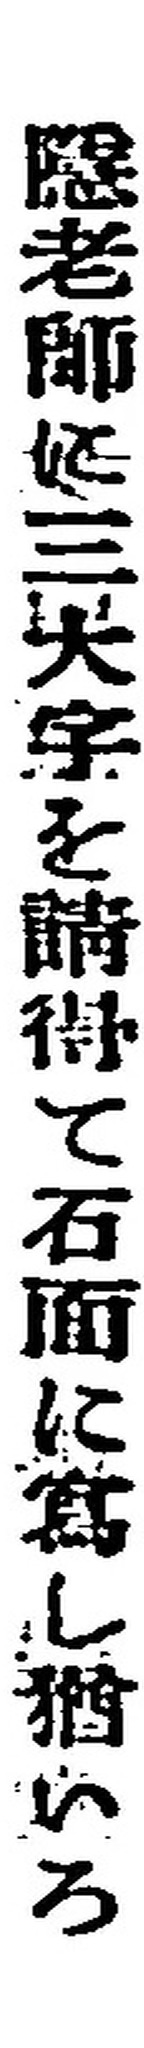隠老師に三大字を請得て石面に写し猶いろ
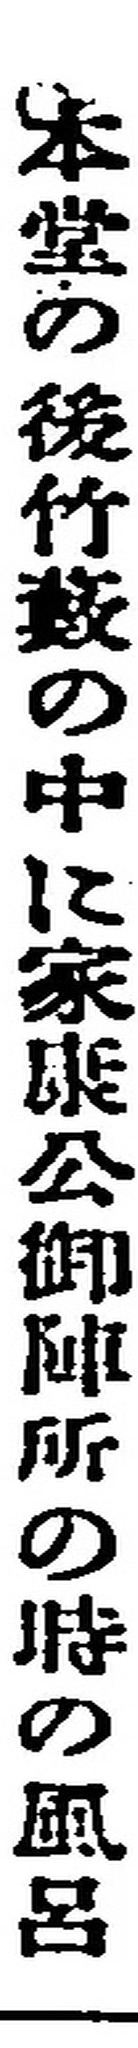本堂の後竹藪の中に家康公御陣所の時の風呂
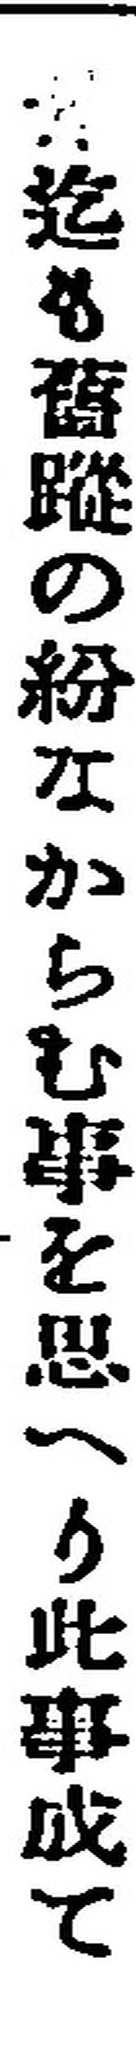迄も旧蹤の紛なからむ事を思へり此事成て
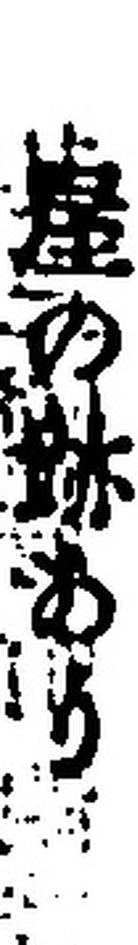屋の跡あり
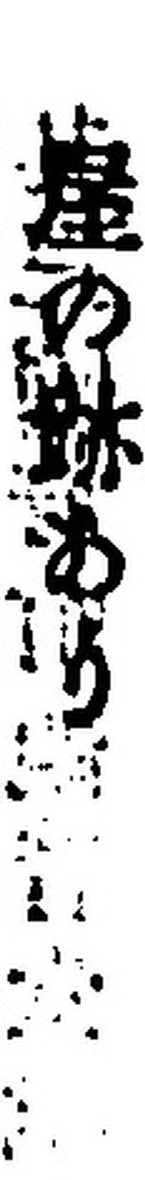屋の跡あり
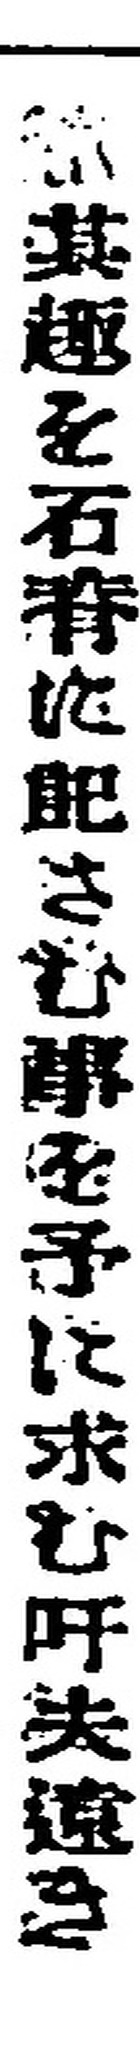其趣を石脊に記さむ事を予に求む吁夫遠き
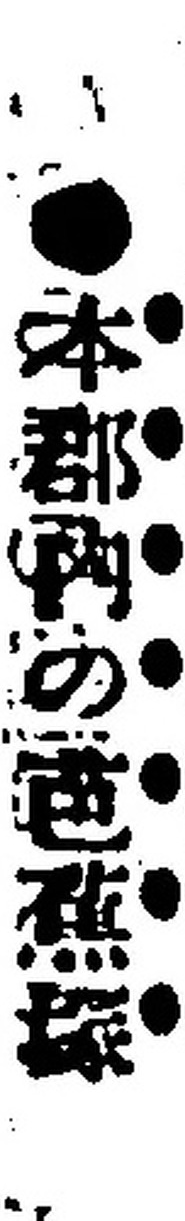●本郡内の芭蕉塚
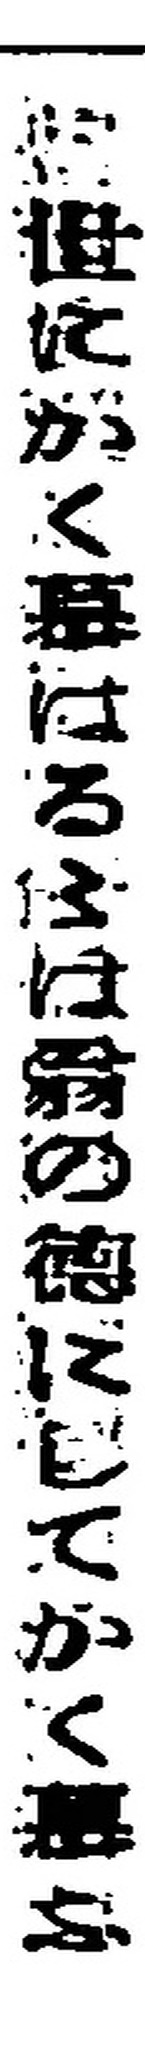世にかく慕はるゝは翁の徳にしてかく慕ふ
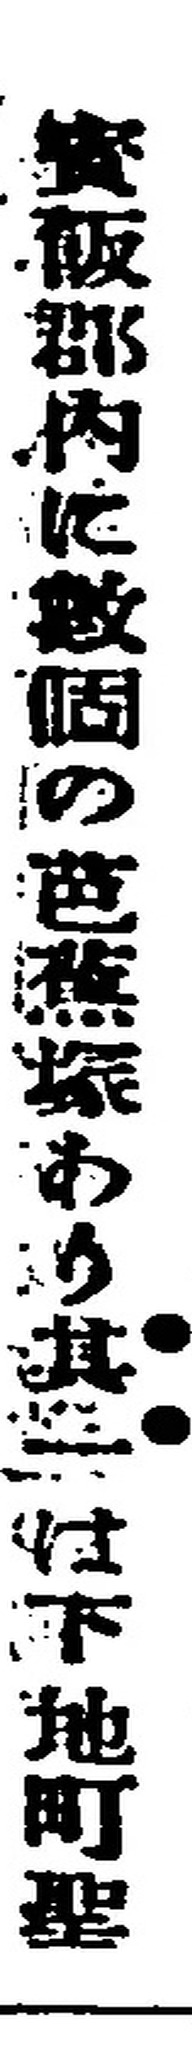宝飯郡内に数個の芭蕉塚あり其一は下地町聖
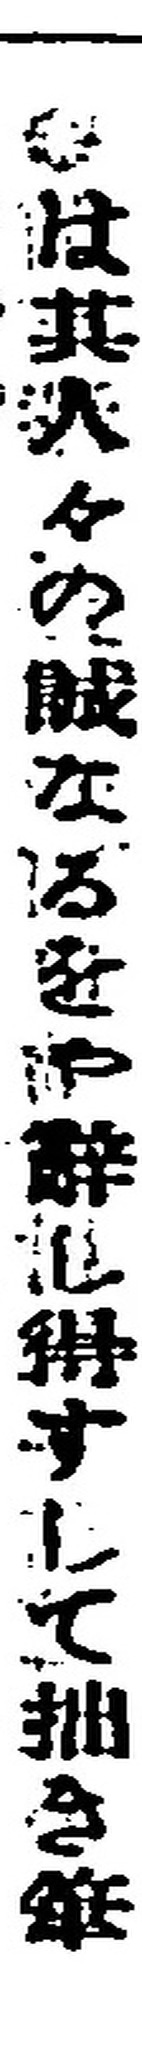は其人々の誠なるをや辞し得すして拙き筆
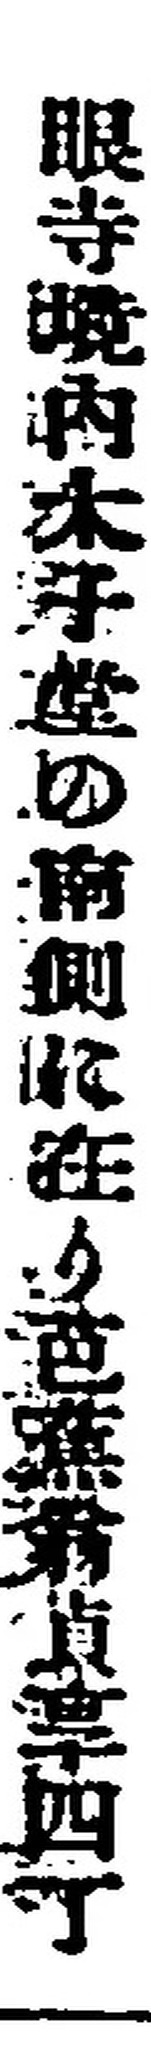眼寺境内太子堂の南側に在り芭蕉翁貞享四丁
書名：東参名勝案内
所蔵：国立国会図書館 National Diet Library, JAPAN
